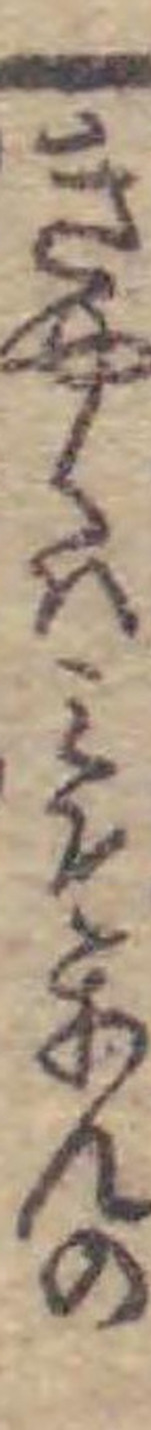きやくはみそあんの
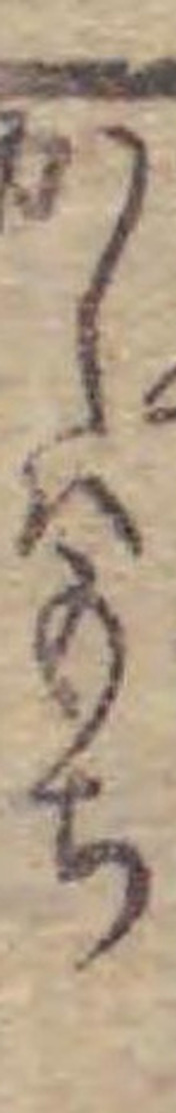かしはもち
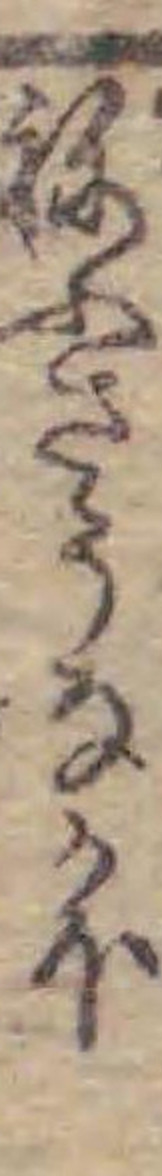ねふさうなかほ
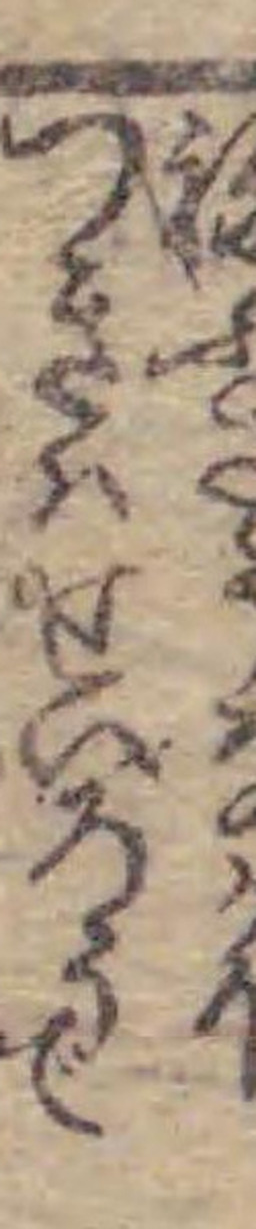つきはせいろうで
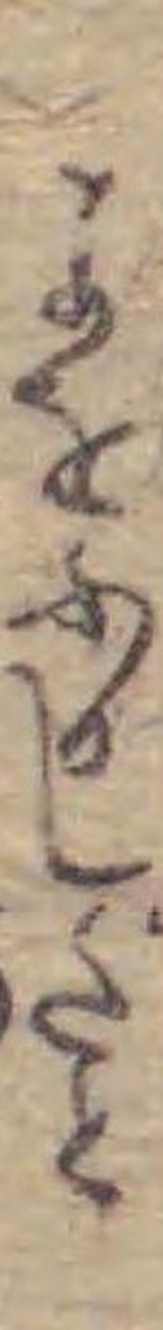よをふかしたと
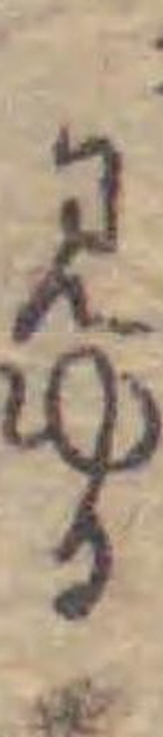みゆる
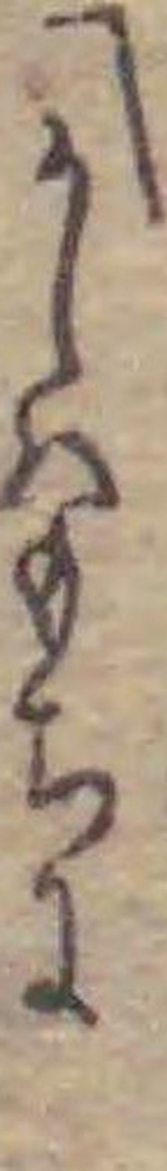〽かしはもちに
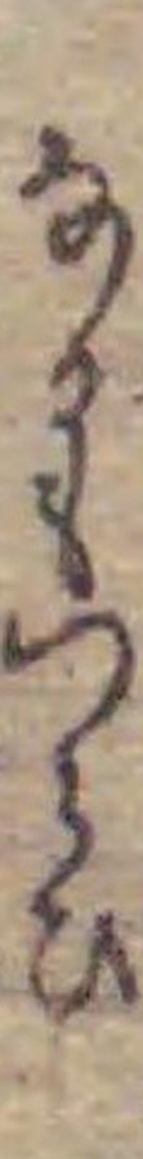なるもつらひ

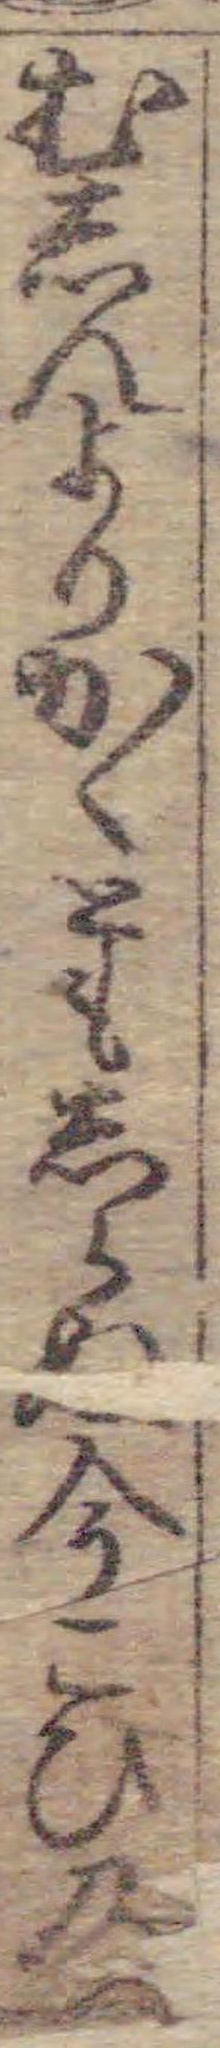むしんよりかくともしらぬ今こひの
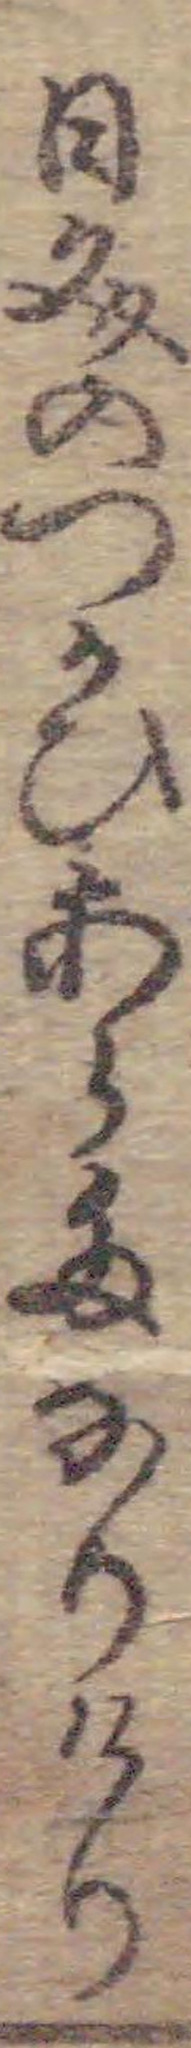日文のつかひあらたなりけり
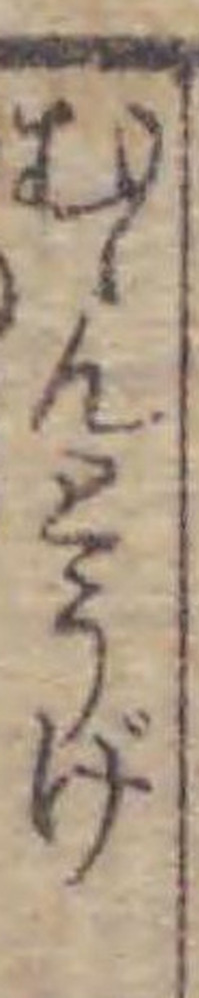むしんとうげ
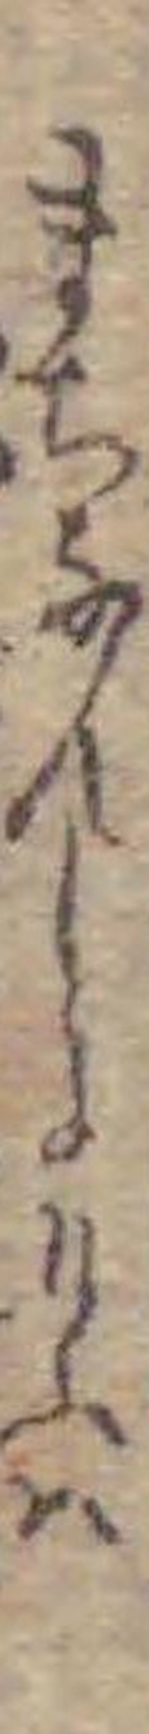まちなんしよけふは
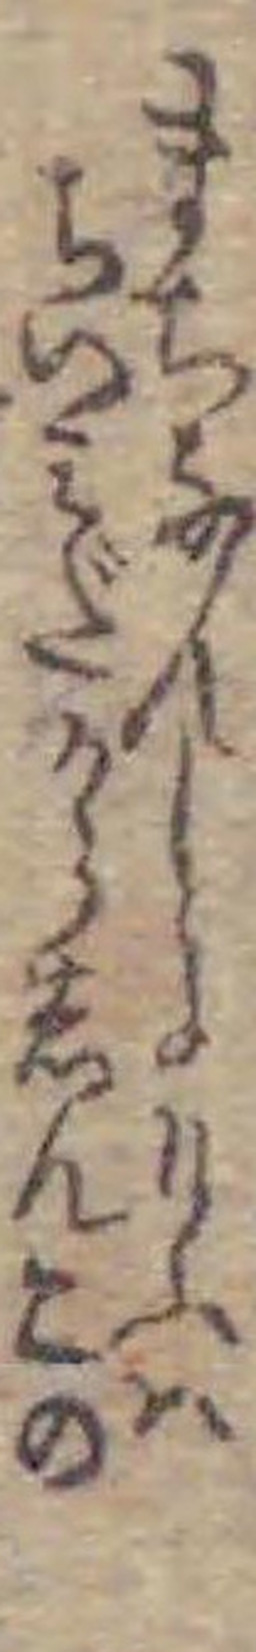ちいみだからしんこの
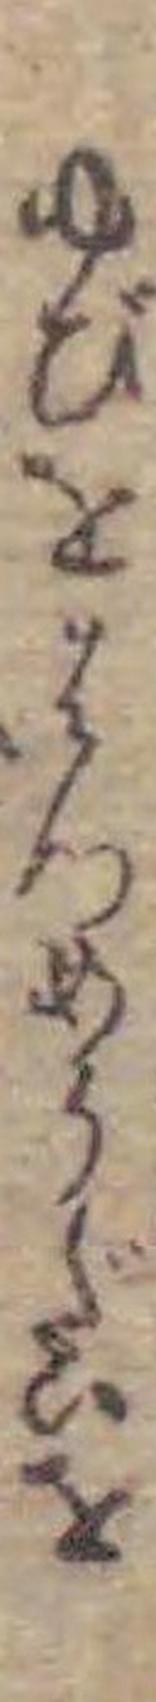ゆびをはつめうだいを
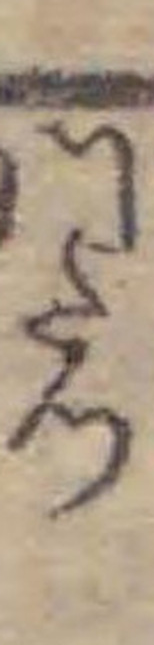門たつ
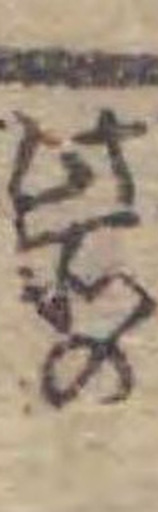此所の
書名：北国順礼唄方便 : 3巻
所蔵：国立国会図書館 National Diet Library, JAPAN
